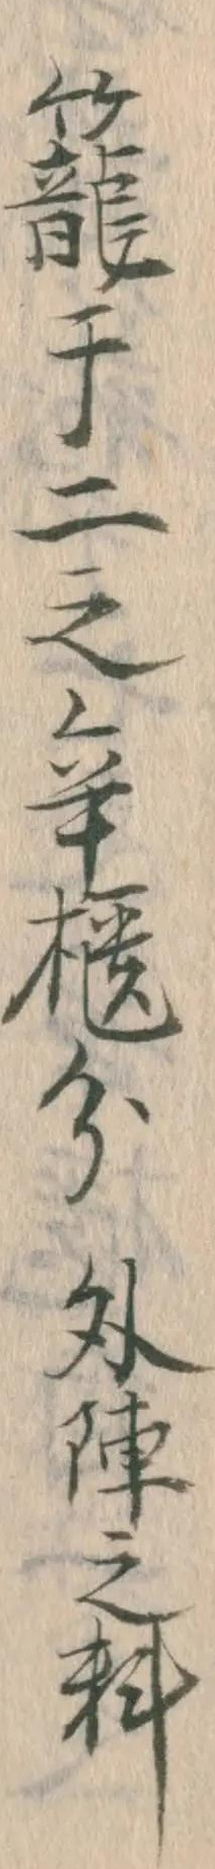籠于二之辛櫃分外陣之料
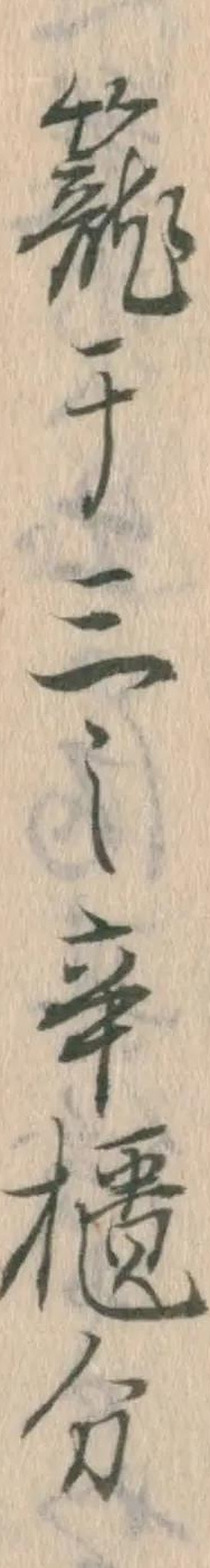籠于三之辛櫃分
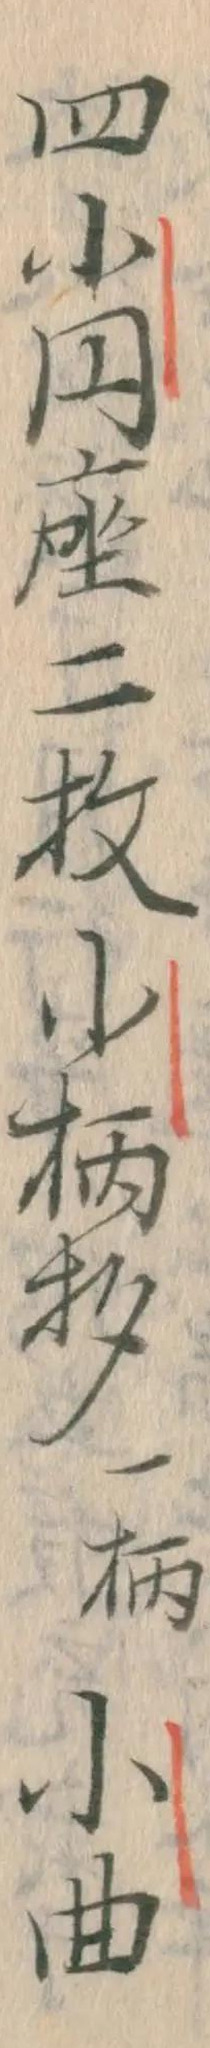四小円座二枚小柄杓一柄小曲
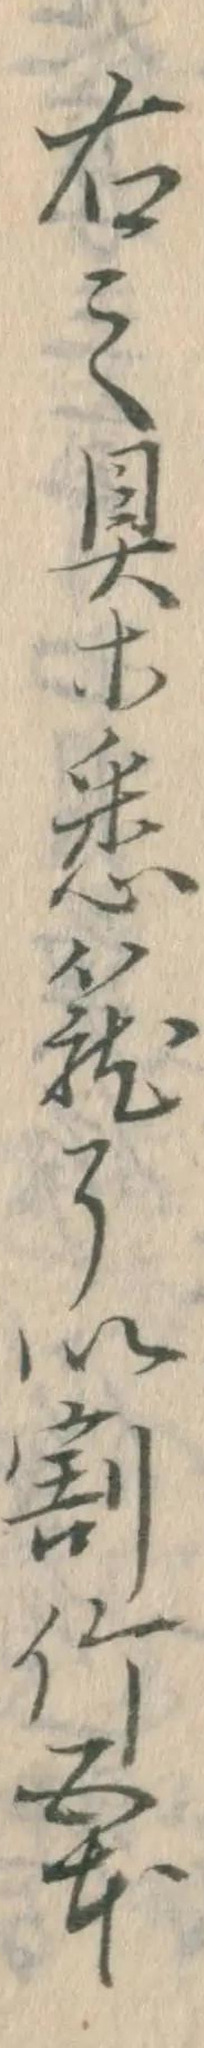右之具等悉籠了以割竹五本
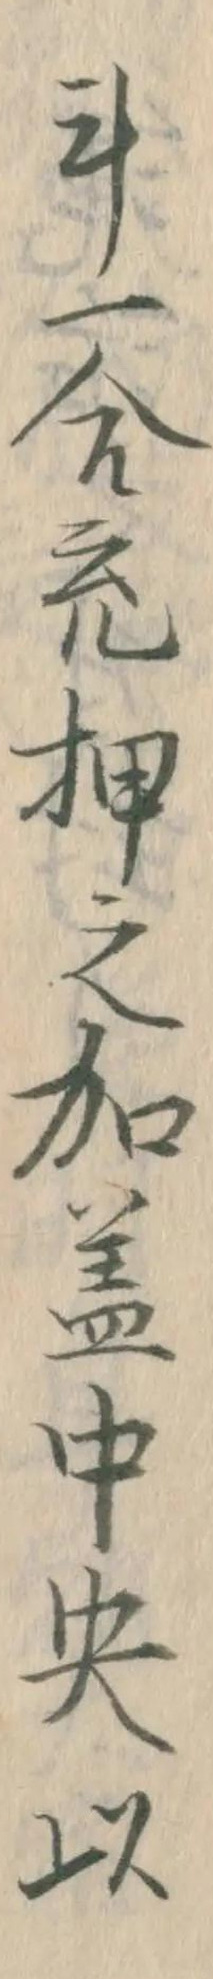斗一合充押之加蓋中央以

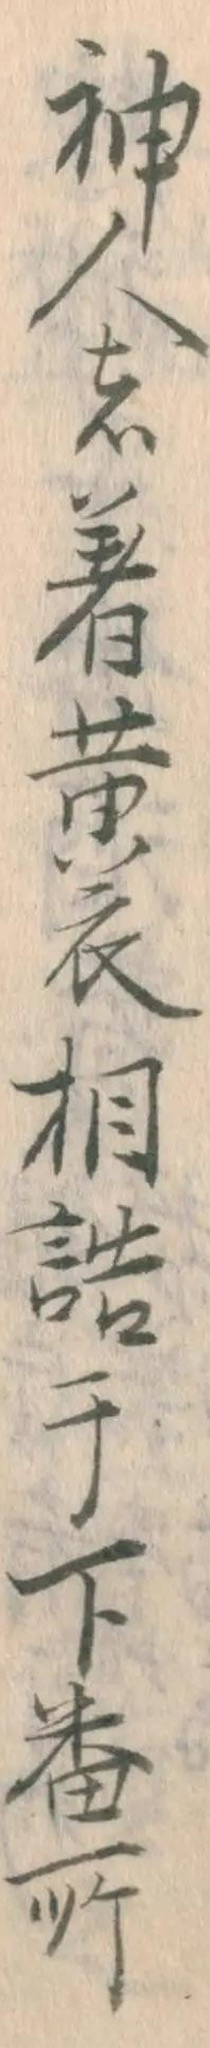神人者着黄衣相詰于下番所
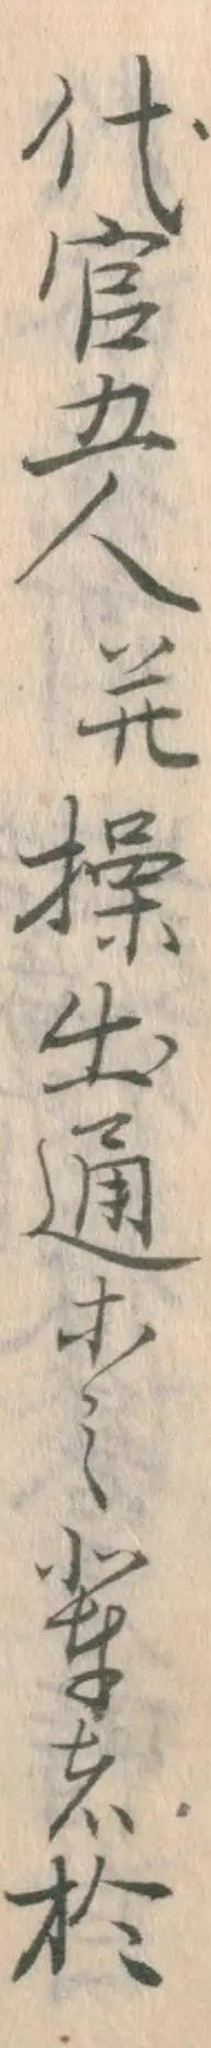代官五人并操出通等之輩者於
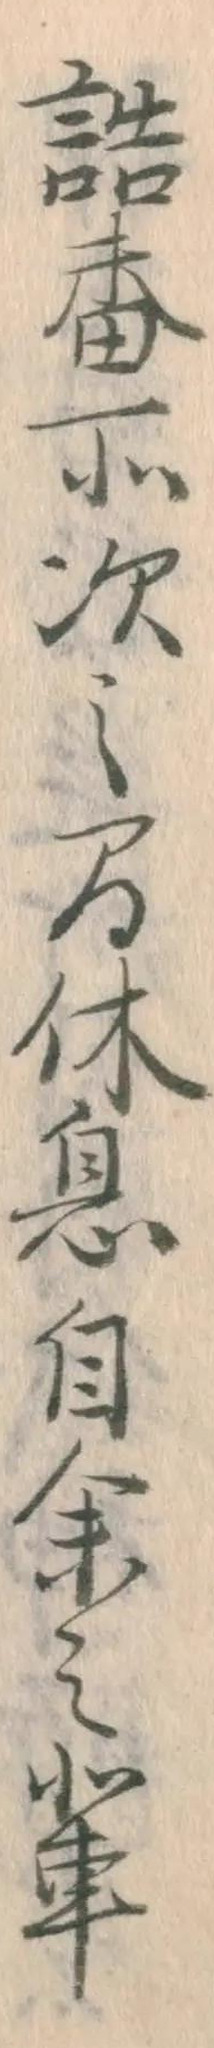詰番所次之間休息自余之輩
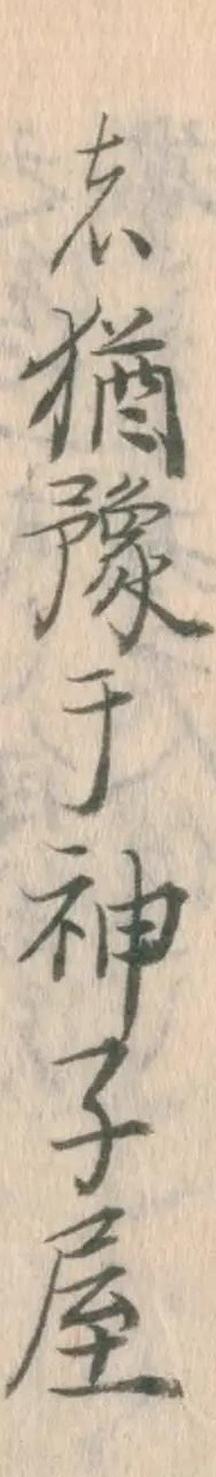者猶予于神子屋
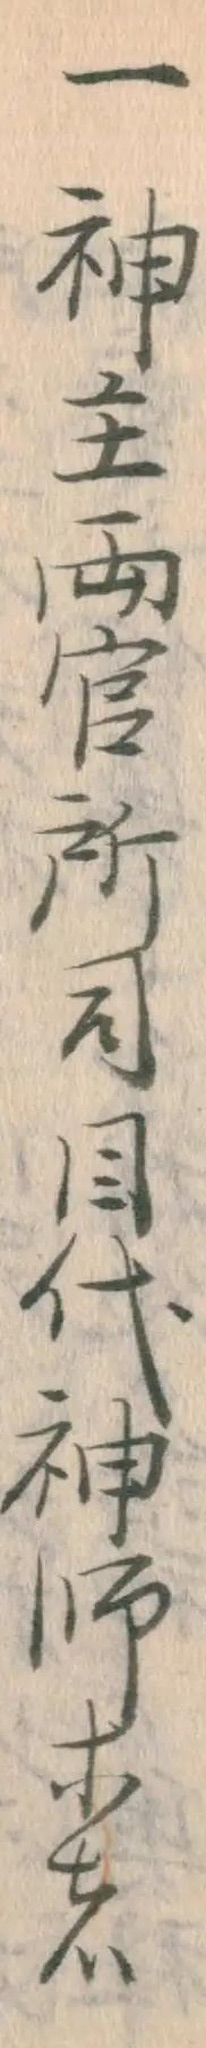一神主両官所司目代神師等者
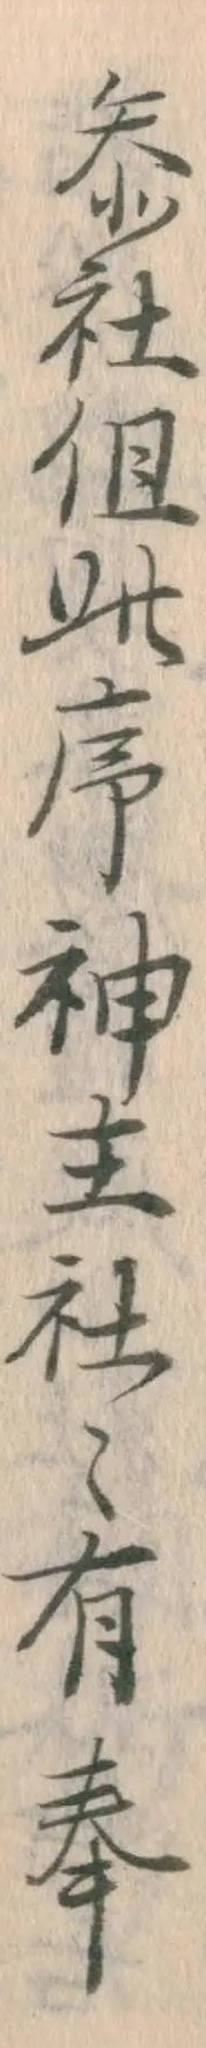参社但此序神主社々有奉
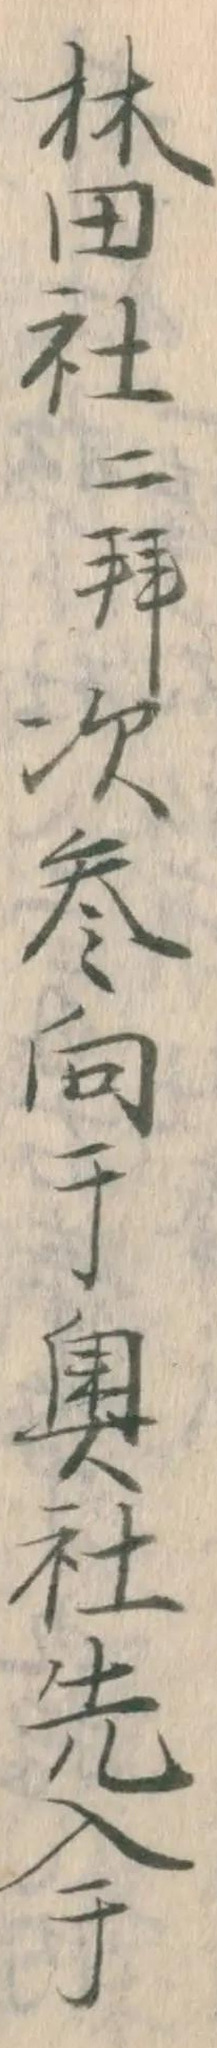林田社二拝次参向于奥社先入于

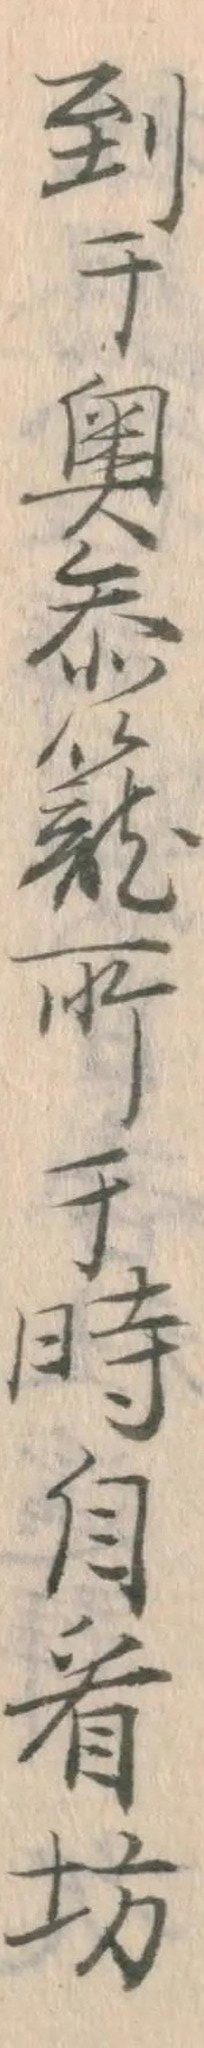到于奥参籠所于時自看坊
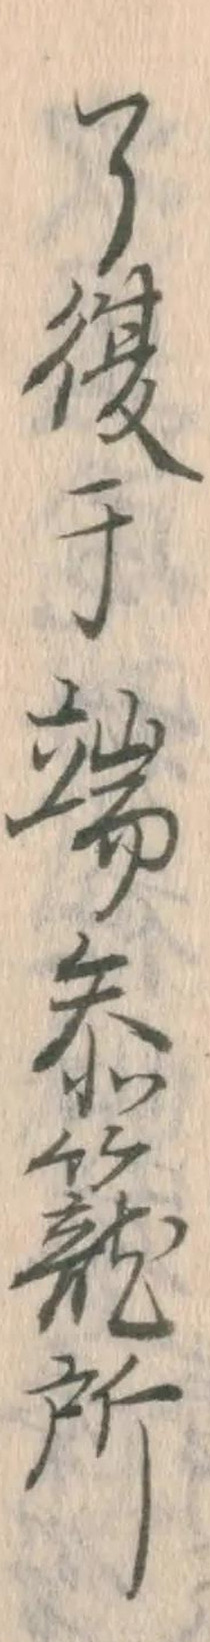了復于端参籠所
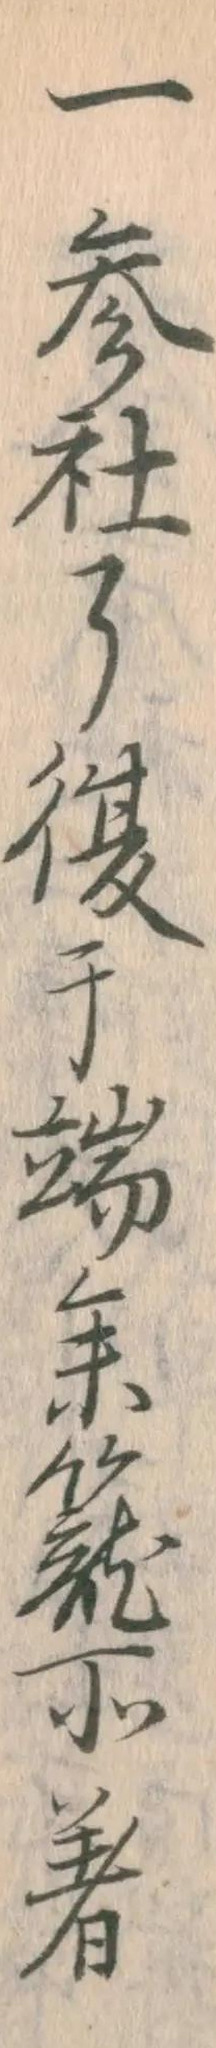一参社了復于端参籠所着
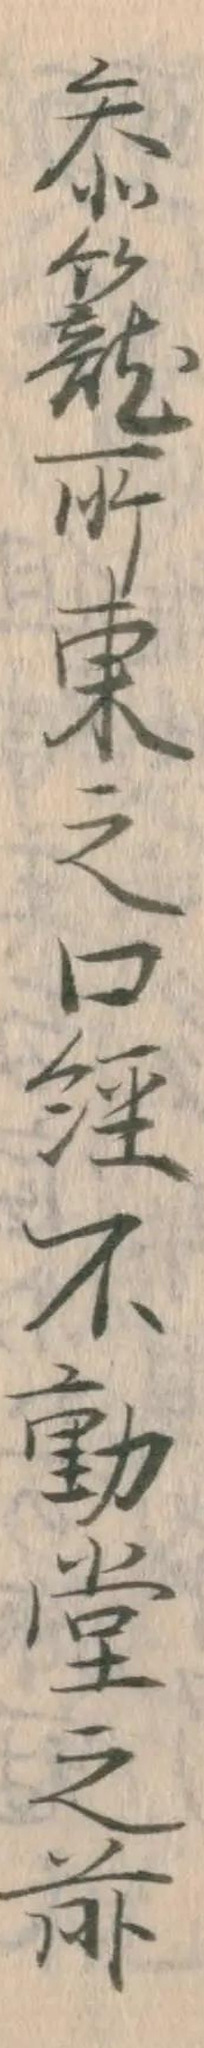参籠所東之口経不動堂之前
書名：賀茂社記録. 第81冊
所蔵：国立国会図書館 National Diet Library, JAPAN
